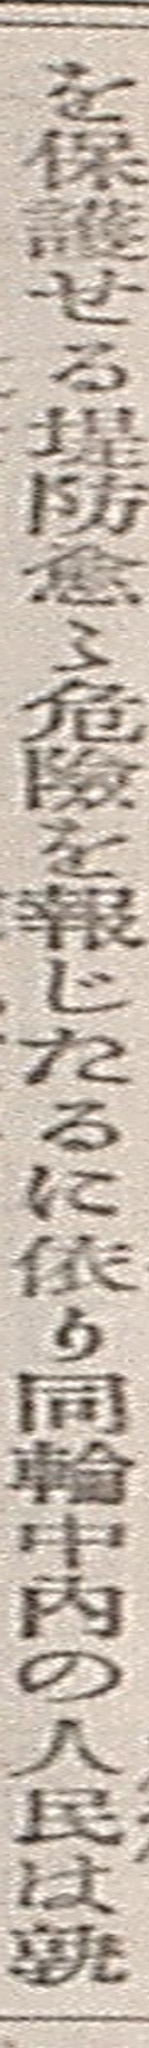を保護せる堤防愈々危険を報じたるに依り同輪中内の人民は孰
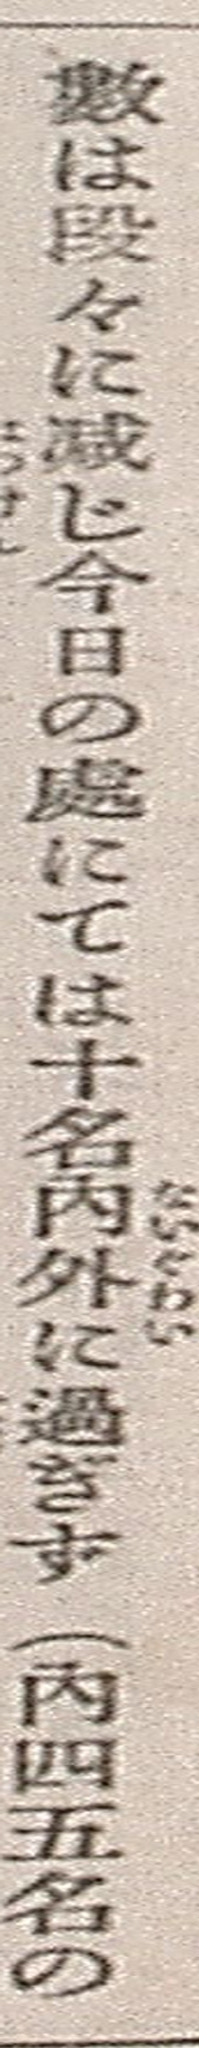数は段々に減じ今日の処にては十名内外に過ぎず（内四五名の
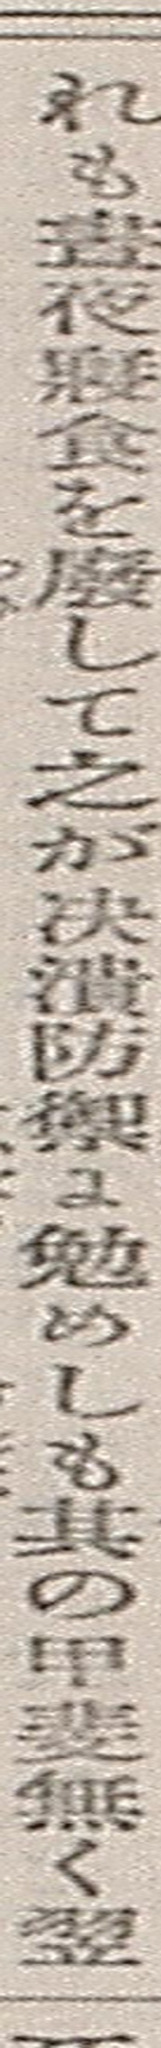れも晝夜寝食を廃して之が决潰防禦に勉めしも其の甲斐無く翌
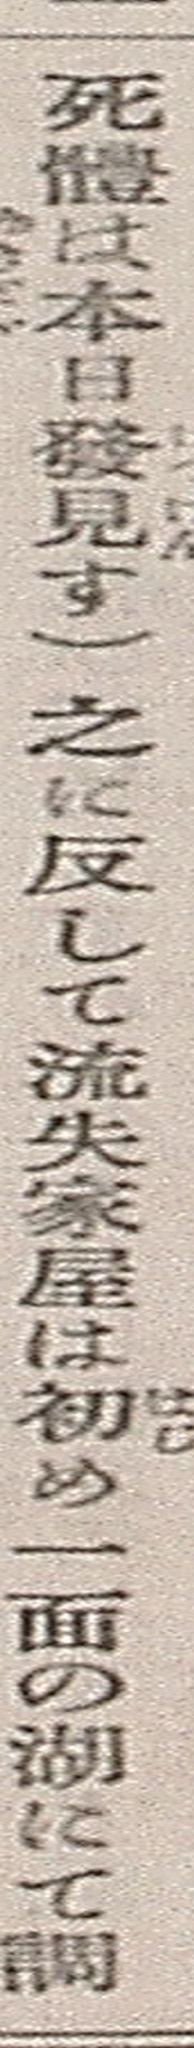死体は本日発見す）之に反して流失家屋は初め一面の湖にて調
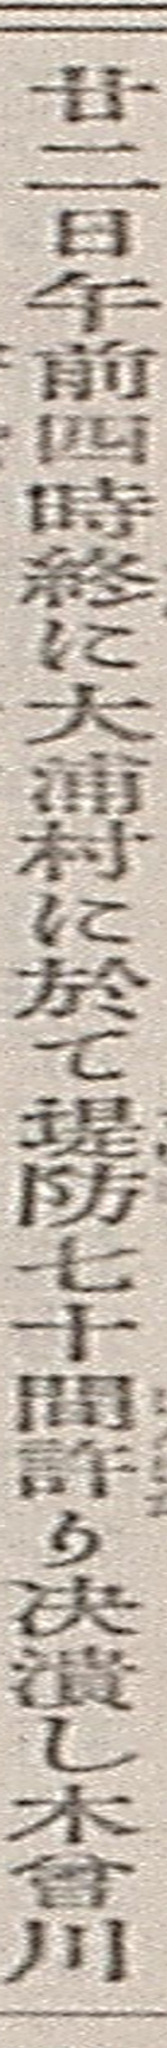廿二日午前四時終に大浦村に於て堤防七十間許り决潰し木曽川
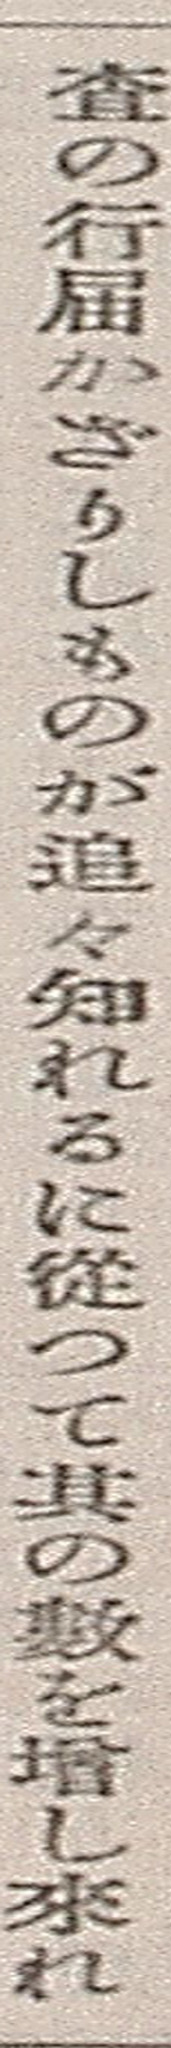査の行届かざりしものが追々知れるに従つて其の数を増し来れ
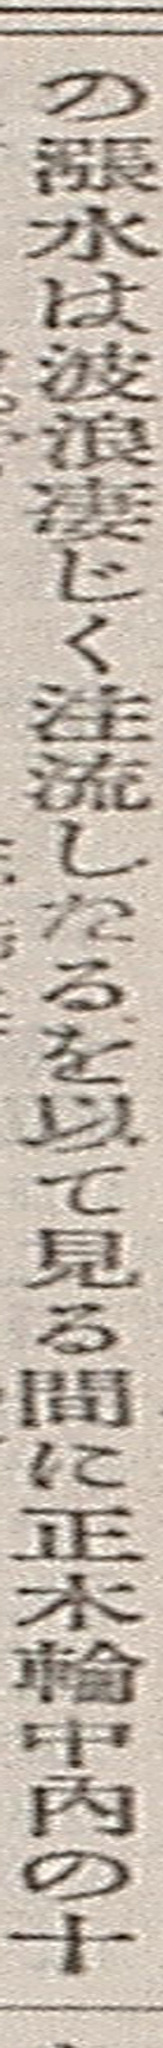の漲水は波浪凄じく注流したるを以て見る間に正木輪中内の十
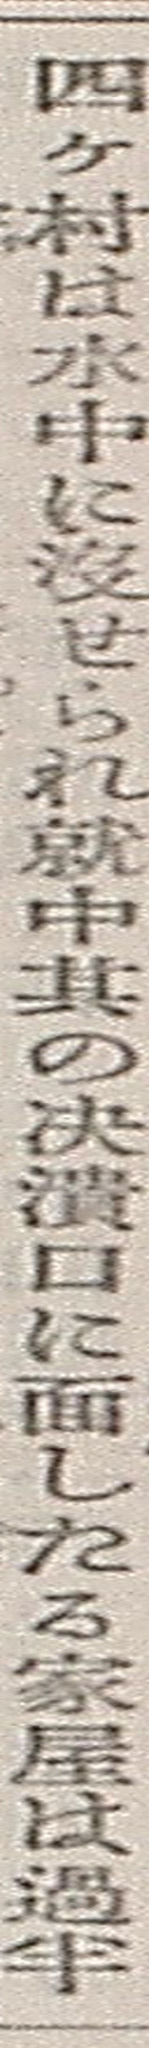四ヶ村は水中に没せられ就中其の决潰口に面したる家屋は過半
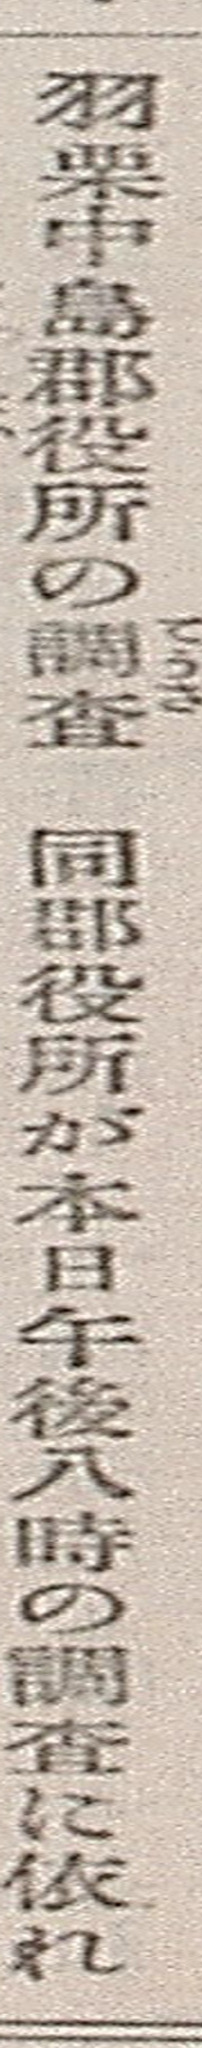羽栗中島郡役所の調査同郡役所が本日午後八時の調査に依れ
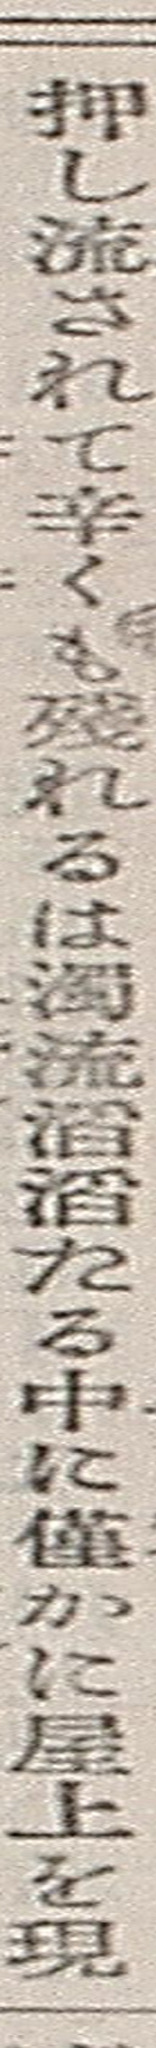押し流されて辛くも残れるは濁流滔滔たる中に僅かに屋上を現
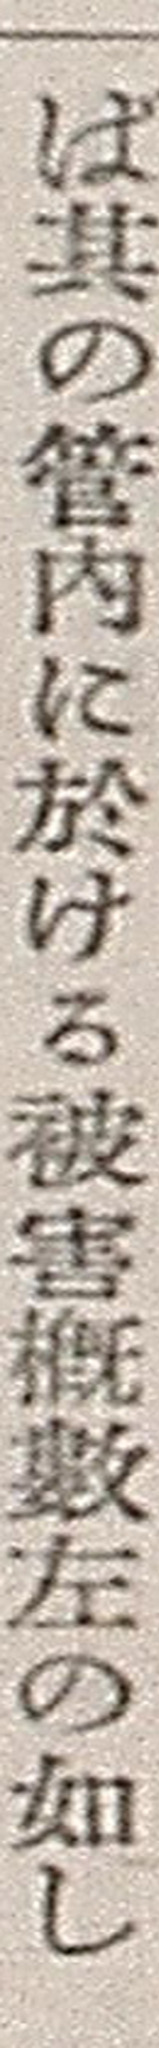ば其の管内に於ける被害概数左の如し
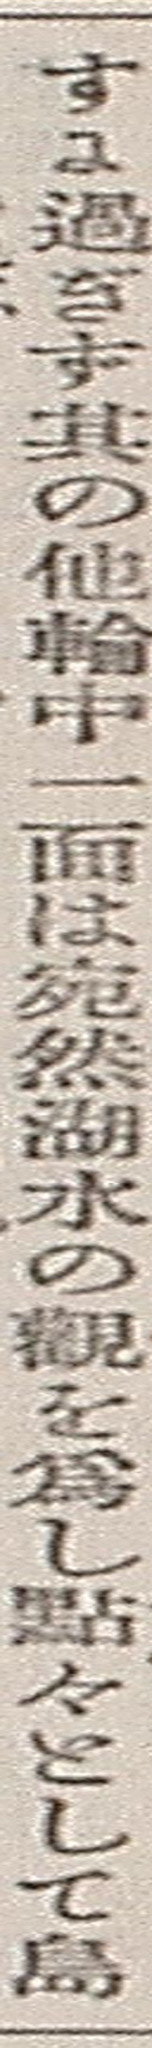すに過ぎず其の他輪中一面は宛然湖水の観を為し点々として島
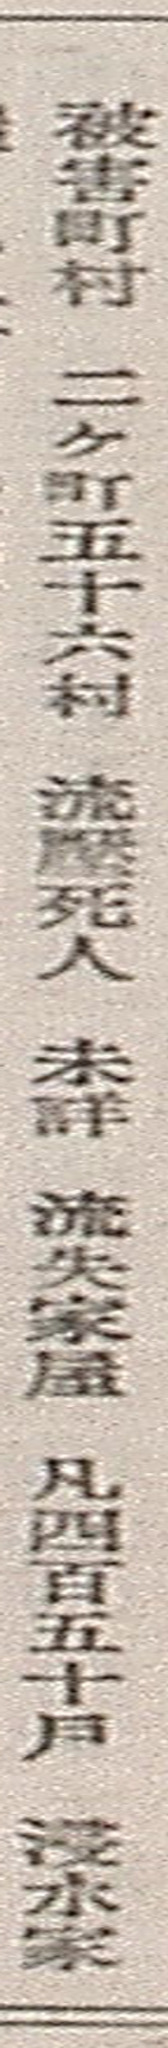被害町村二ヶ町五十六村流壓死人未詳流失家屋凡四百五十戸浸水家
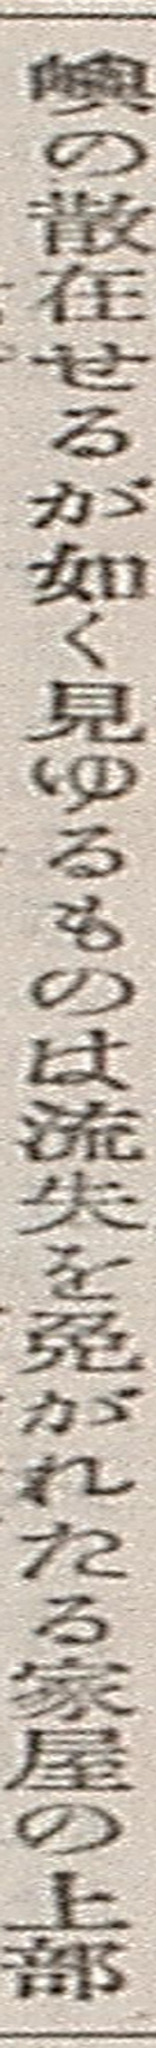嶼の散在せるが如く見ゆるものは流失を免がれたる家屋の上部
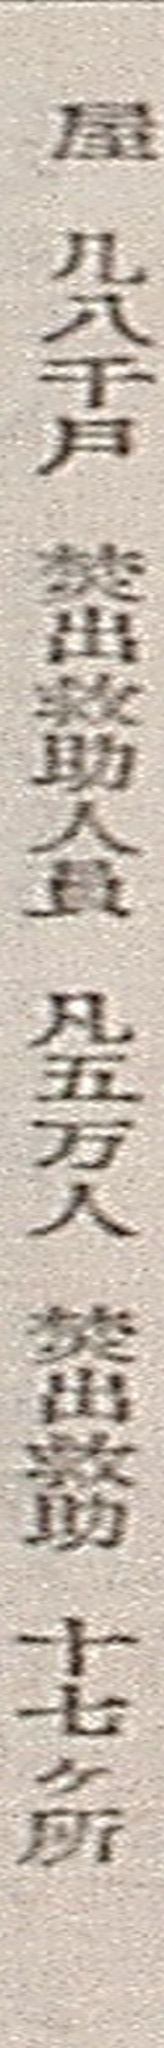屋凡八千戸焚出救助人員凡五万人焚出救助十七ヶ所
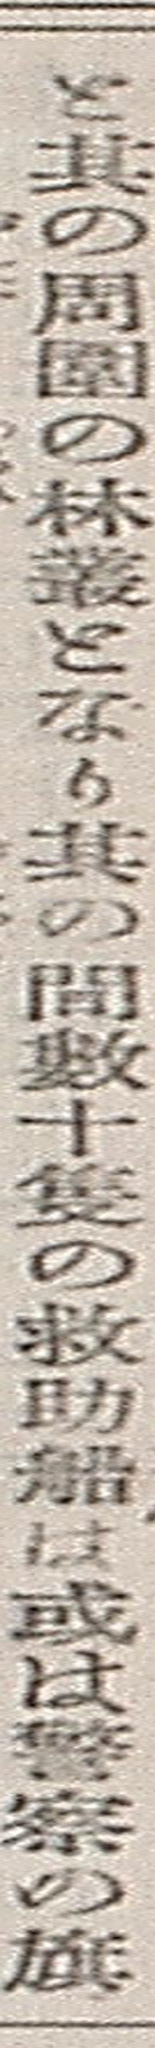と其の周囲の叢となり其の間数十隻の救助船は或は警察の旗
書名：風俗畫報臨時増刊第百二十六號　洪水被害録（中）
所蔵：東京大学地震研究所図書室 Earthquake Research Institute Library, The University of Tokyo, JAPAN
